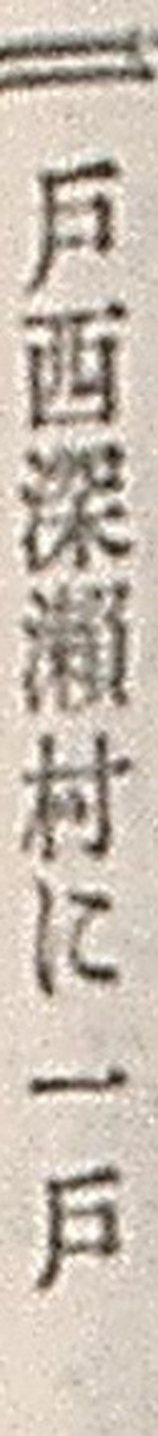戸西深瀬村に一戸
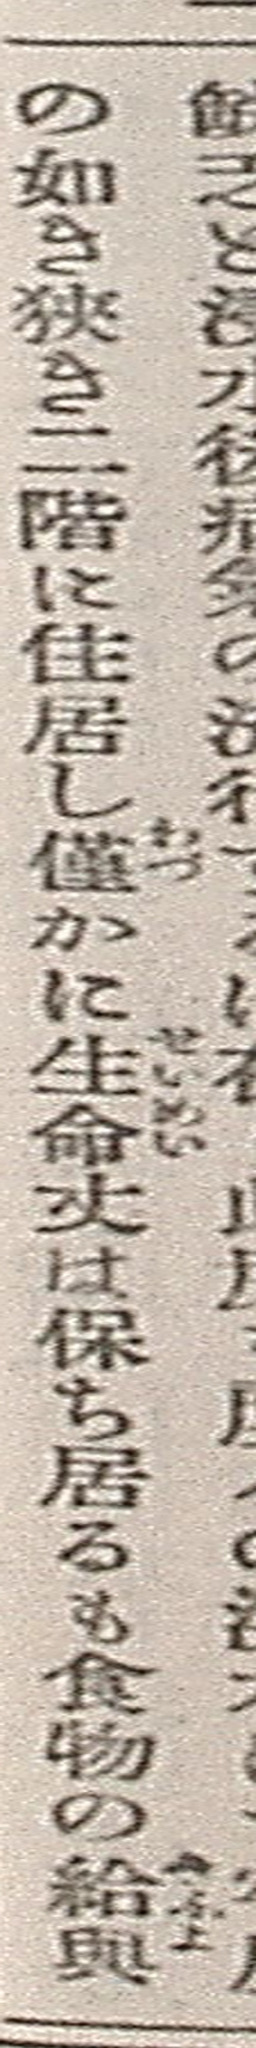の如き狭き二階に住居し僅かに生命丈は保ち居るも食物の給与
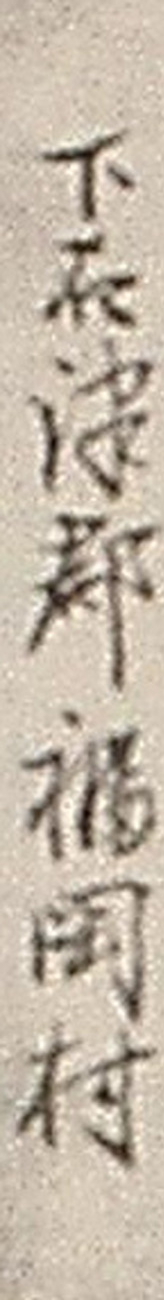下石津郡福岡村
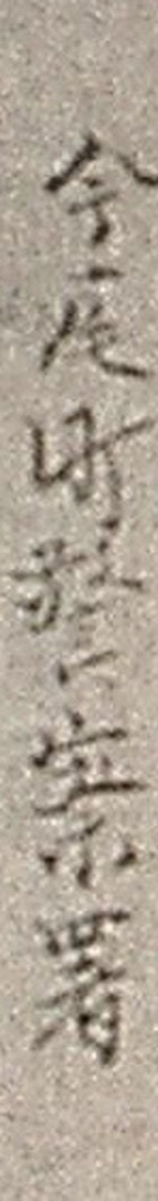今尾町警察署
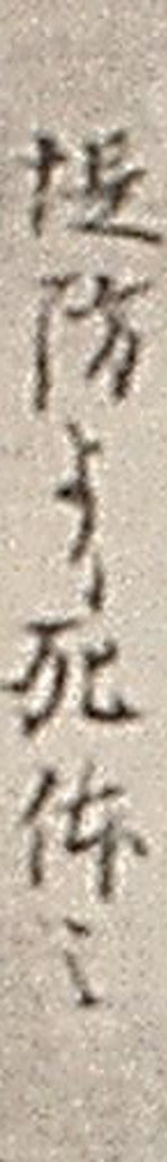堤防より死体之
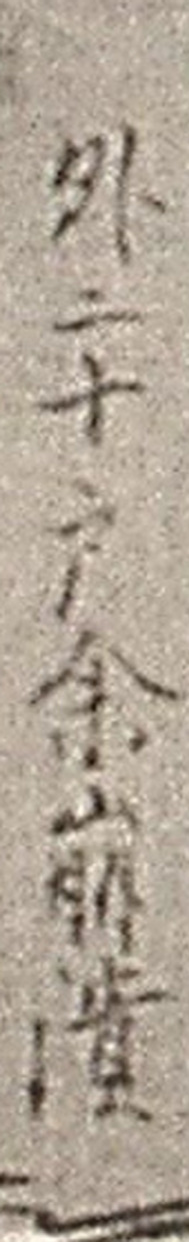外二十戸余崩潰
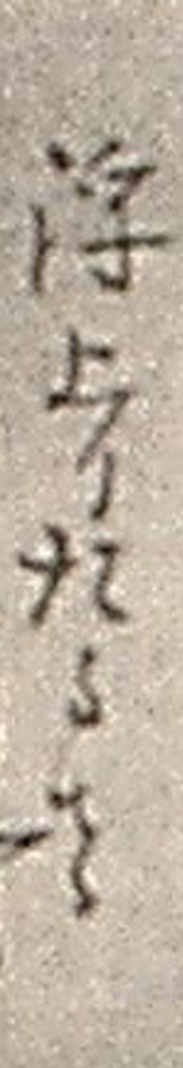浮上りたるを見る
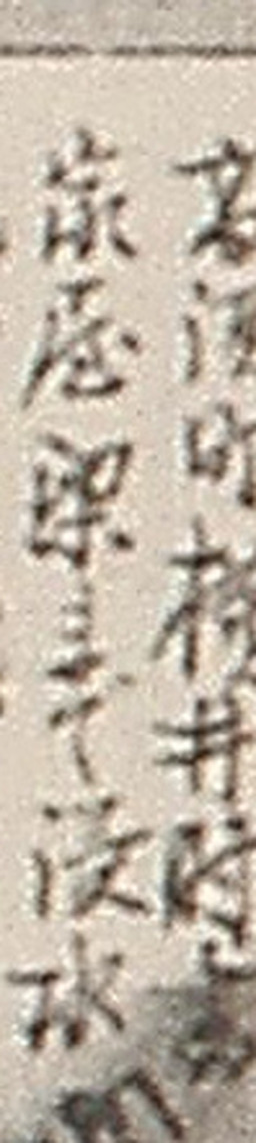家屋梁まで浸水

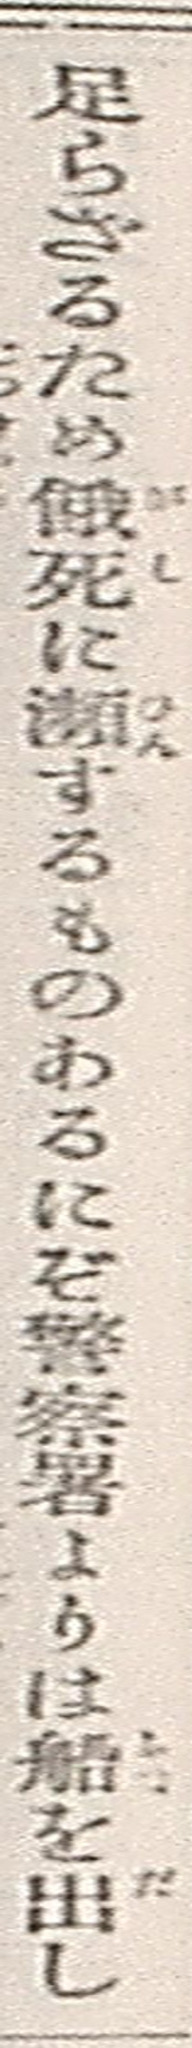足らざるため餓死に瀕するものあるにぞ警察署よりは船を出し
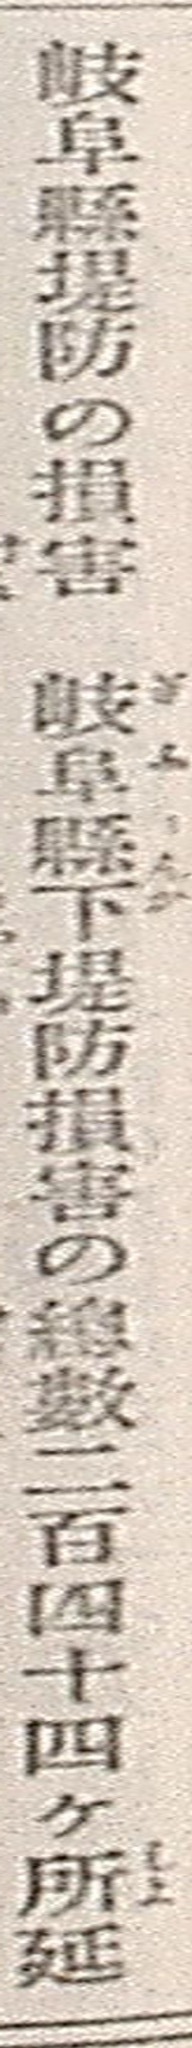岐阜県堤防の損害岐阜県下堤防損害の総数二百四十四ヶ所延
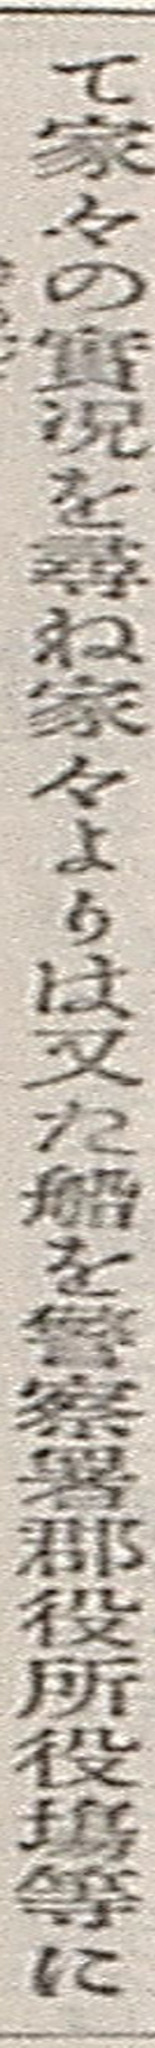て家々の実況を尋ね家々よりは又た船を警察署郡役所役場等に
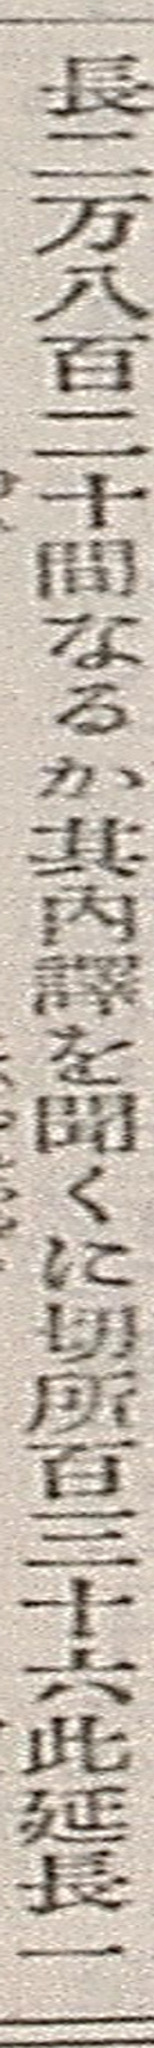長二万八百二十間なるか其内訳を聞くに切所百三十六此延長一
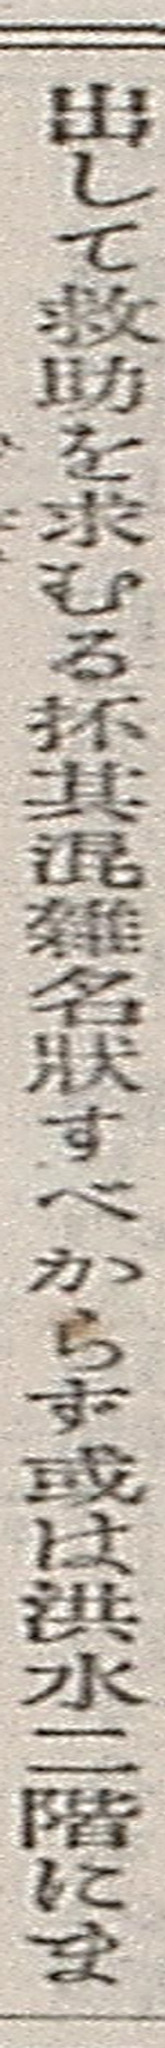出して救助を求むる抔其混雑名状すべからず或は洪水二階にま
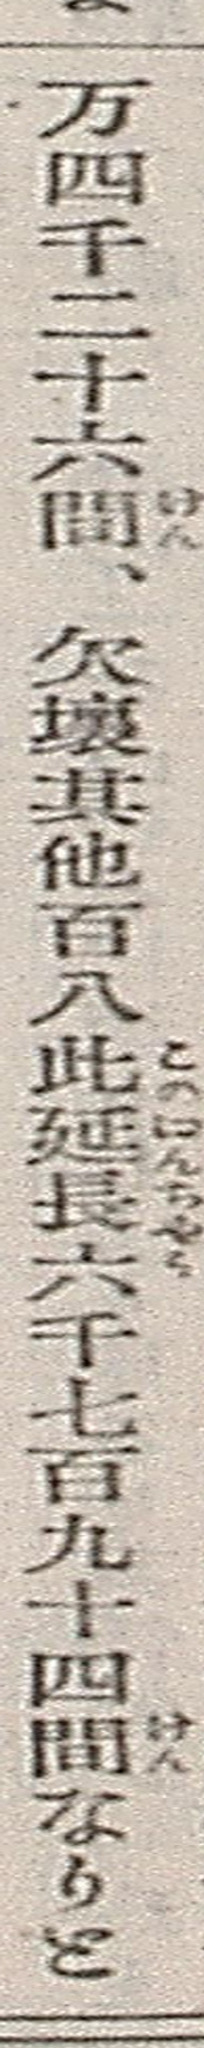万四千二十六間、欠壊其他百八此延長六千七百九十四間なりと
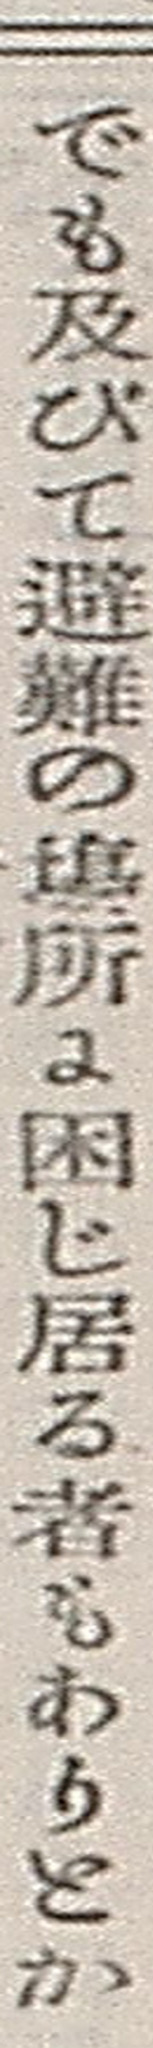でも及びて避難の場所に困じ居る者もありとか
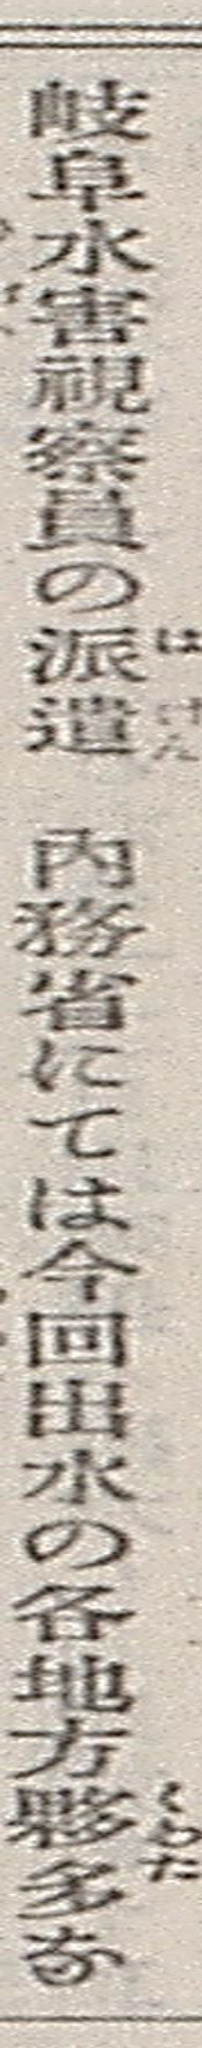岐阜水害視察員の派遣内務省にては今回出水の各地方夥多な
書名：風俗畫報臨時増刊第百二十六號　洪水被害録（中）
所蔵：東京大学地震研究所図書室 Earthquake Research Institute Library, The University of Tokyo, JAPAN
